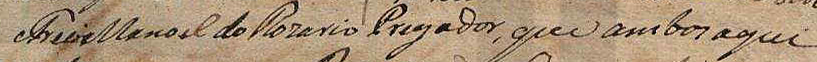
Frei Manoel do Rozario Pregador, que ambos aqui
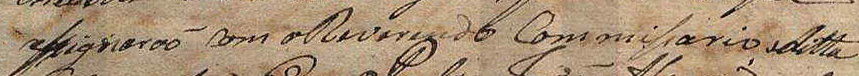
assignaraõ com o Reverendo Commissario e ditta
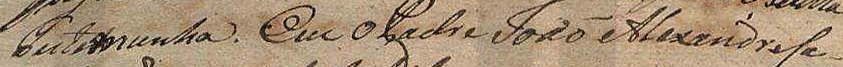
Testemunha. E eu o Padre Ioaõ Alexandre Ca
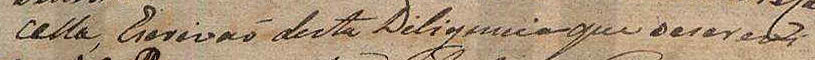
cella, Escrivaõ desta Diligencia que o escrevi
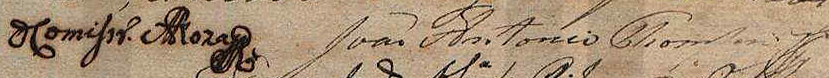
o Comissr.o Roza Joaõ Antonio Thompson
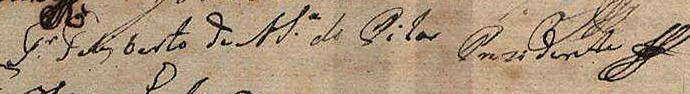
P. Felisbesto da NS.a do Pilar Presidente
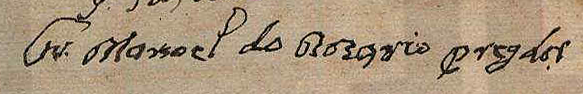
Fr. Manoel do Rozario pregador
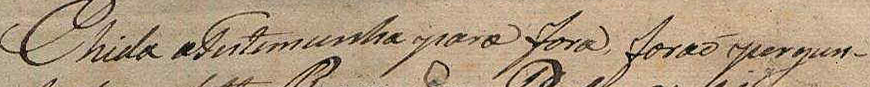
E hida a Testemunha para fora foraõ pergun
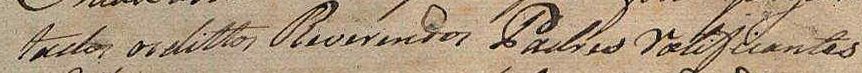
tados os dittos Reverendos Padres ratificantes
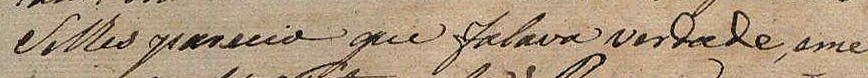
se lhes parecia que falava verdade, e me
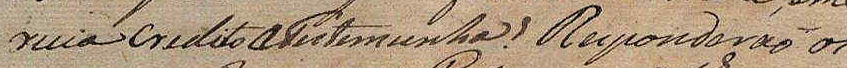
recia credito a Testemunha? Responderaõ os
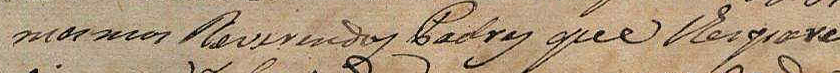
mesmos Reverendos Padres que lhes pare
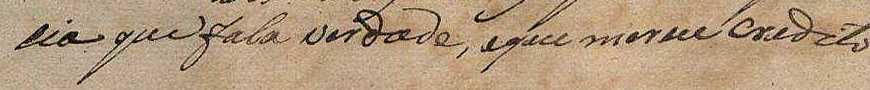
cia que fala verdade, e que merece credito
